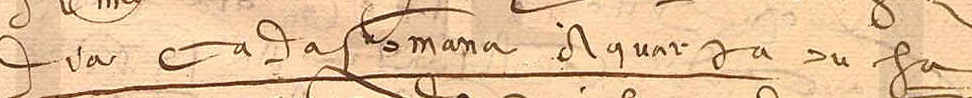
dia Cada Somana A quarta ou ha
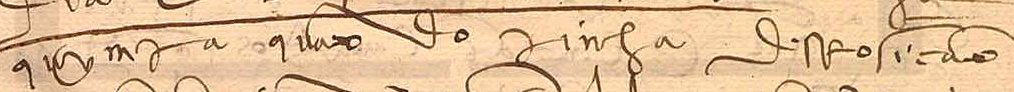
quymta quãodo tinha desposição
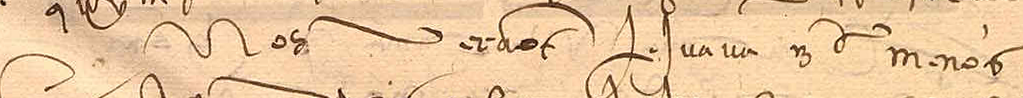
E Nos verãos JeJuaua mto menos
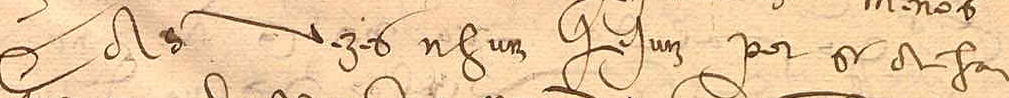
E As vezes nhum JeJum por se Achar
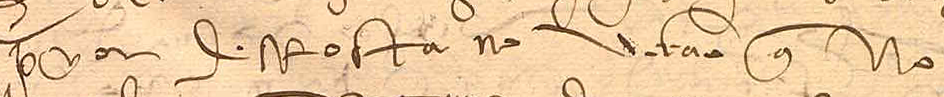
pyor desposta na Verão q̄ No
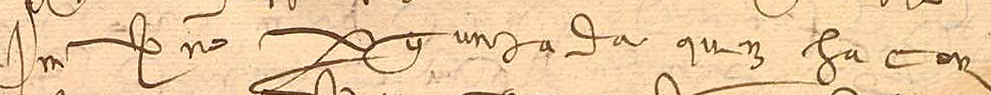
Jmꝟno ꝑguntada quem ha com
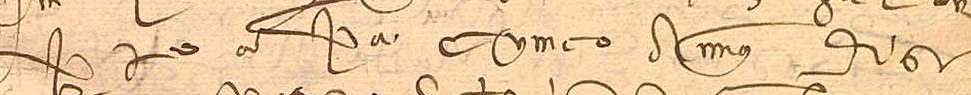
ꝟteo aꝟa cymco Ann̄ꝯ dise
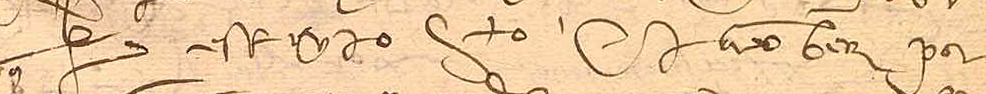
q̄ ho espryto Sto E tão bem por
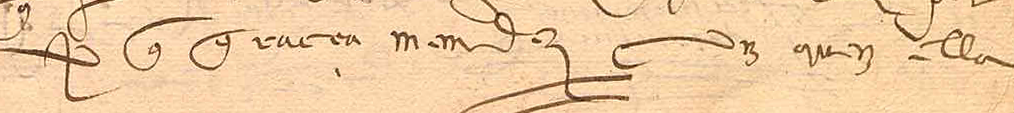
ꝟ q̄ graçea memdez Com quem ella
